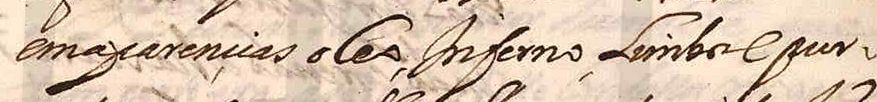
em aparencias o Ceo, Jnferno, Limbo e pur
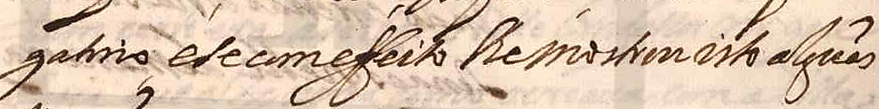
gatorio, e se com effeito lhe mostrou isto alguās
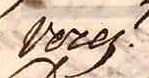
vezes?
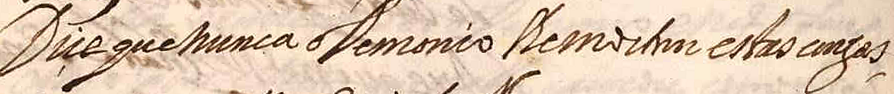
Dice que nunca o Demonio lhe mostrou estas couzas
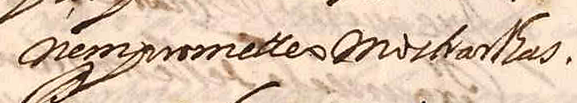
nem prometteo mostrarlhas.
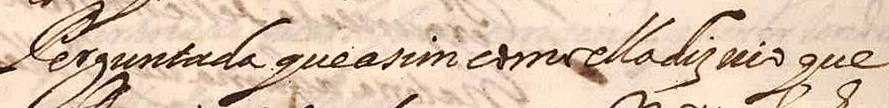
Perguntada que asim como ella diz uio que
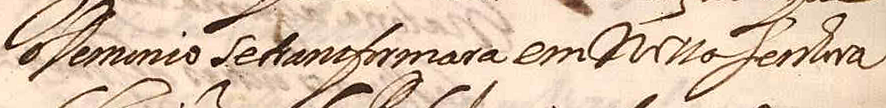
o Demonio se transformara em Nossa Senhora
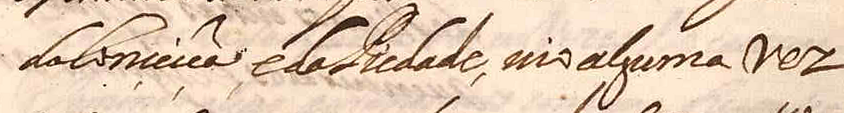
da Conceiçaõ, e da Piedade, uio alguma vez
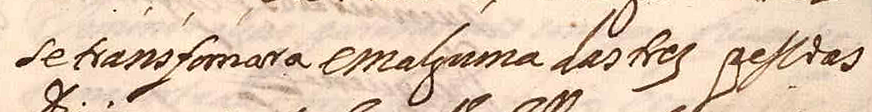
se transfomara em alguma das trez pessoas
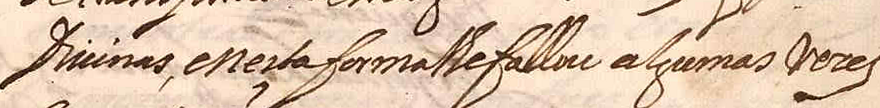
Diuinas, e nesta forma lhe fallou algumas vezes
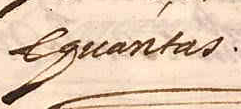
e quantas?
